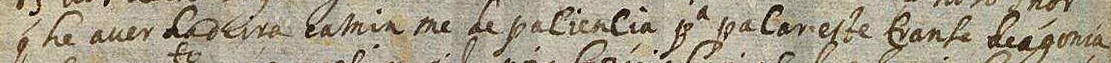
q̄ he a uerdadeira e a min me de paCienCia pa paCar este transe de agonia
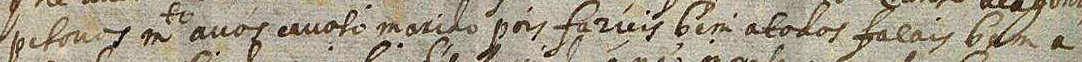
pelo uos mto a uos e a uoso marido pois fazíeis bem a todos facais bem á
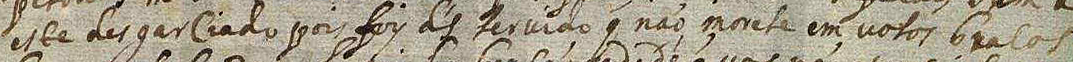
este desgarCiado pois foy ds̄ seruido q̄ naõ morese em uosos bracos
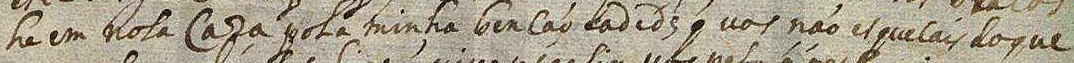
he em nosa Caza pola minha benCaõ e a de d̄s q̄ uos naõ esquecais do que
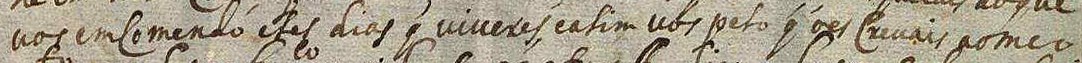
uos emComendo eses dias q̄ uiueres, e asim uos peso q̄ o esCreuais ao meo
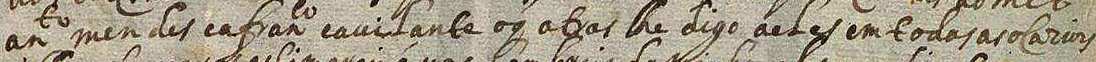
anto mendes e a franco e a uiLante o q̄ atras lhe digo a eLes em todas as oCaziois
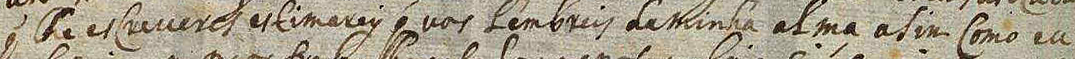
q̄ lhe esCreueres estimarey q̄ uos Lembreis da minha aLma asim Como eu
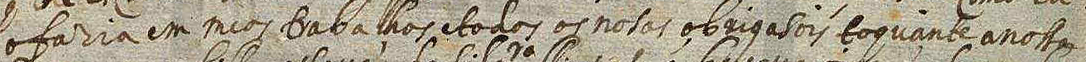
o fazia em meos trabalhos e todos os nosos obrigasois toquante a nossa
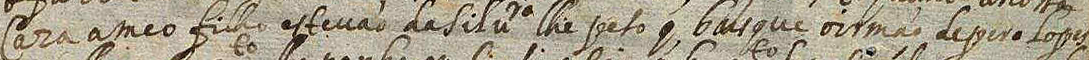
Caza a meo filho esteuaõ da Silura lhe peso q̄ busque o irmaõ de pero Lopes
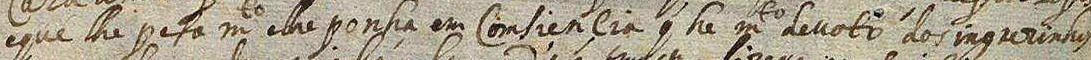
e que lhe pesa mto e lhe ponha em ComsienÇia q̄ he mto deuoto dos ingrezinhos
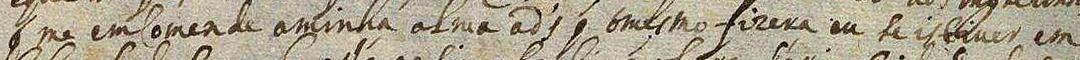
q̄ me emComende a minha aLma a ds̄ q̄ o mesmo fizera ou se istiuer em
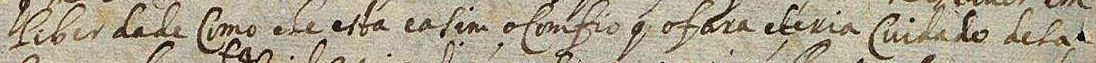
Liberdade Como ele está e asim o Comfio q̄ o fara e teria Cuidado dela
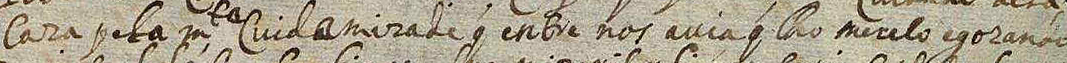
Caza pela mta Cuidamizade q̄ entre nos auia q̄ lho mereCo e gozando
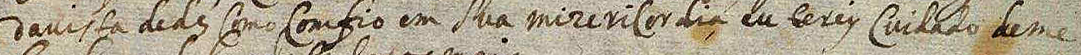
da uista de ds̄ Como Comfio em sua mizeriCordia eu terey Cuidado de me
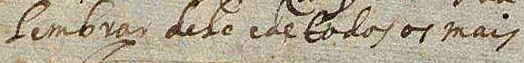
Lembrar deLe e de todos os mais
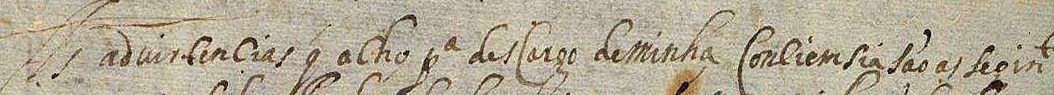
As aduirtenCias q̄ aCho pa desCargo de minha ConCiemsia saõ as segintes
